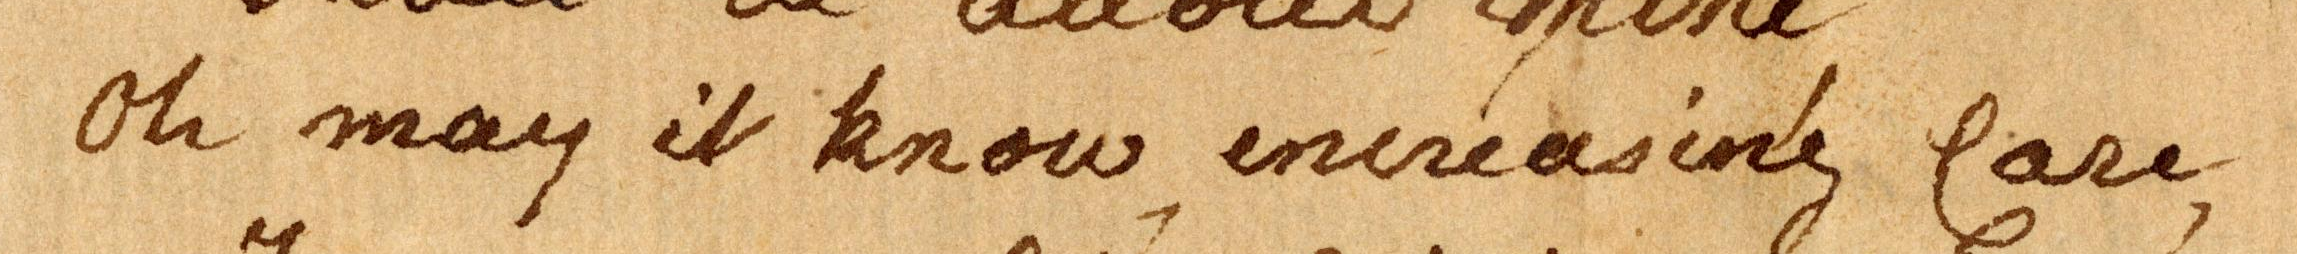Oh may it know encreasing Care,
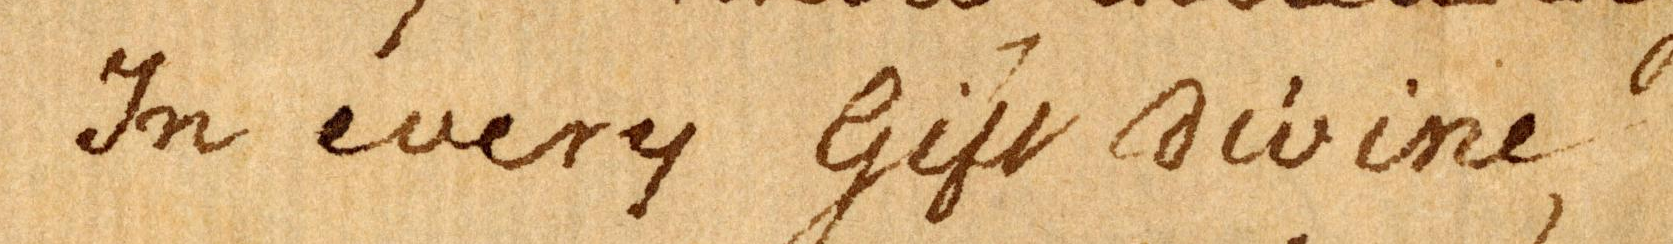In every Gift divine,
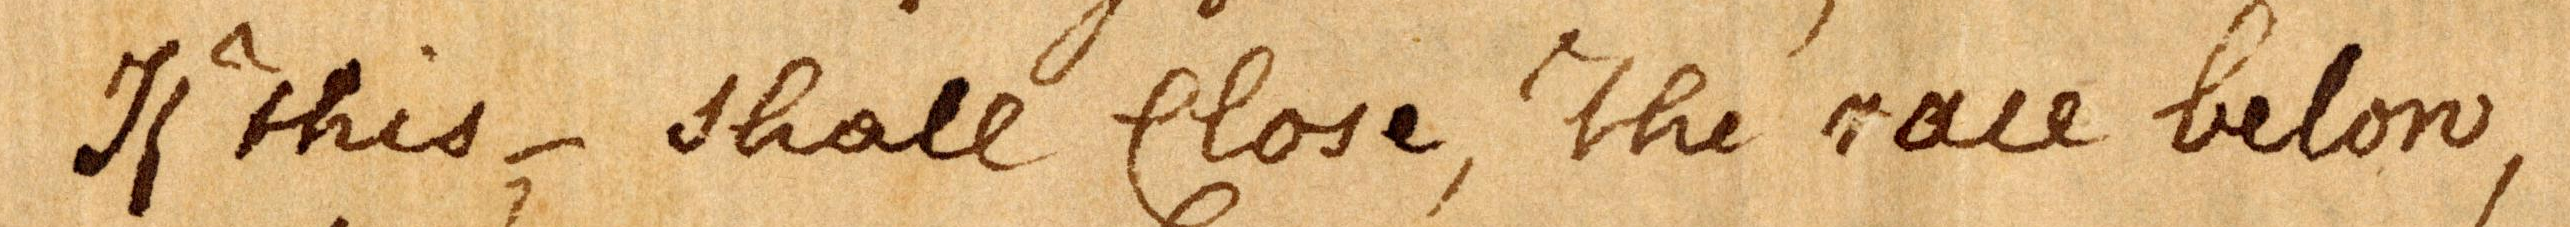If this,- shall Close, the race below,
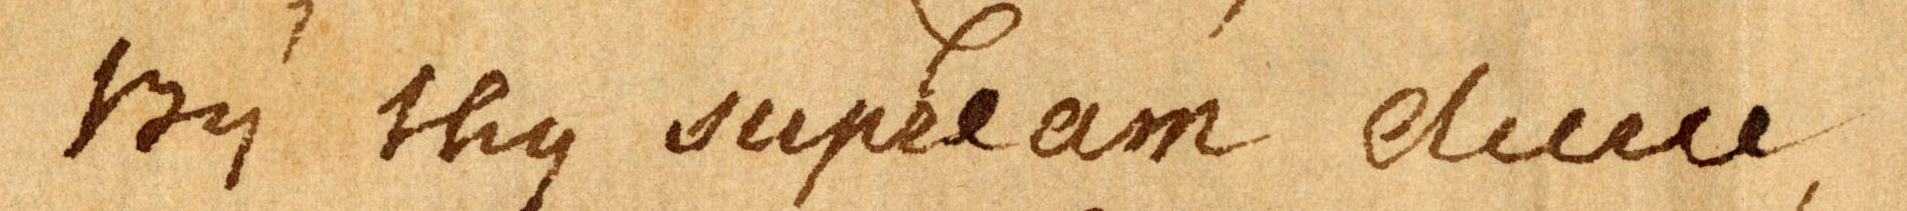By thy supream decree,
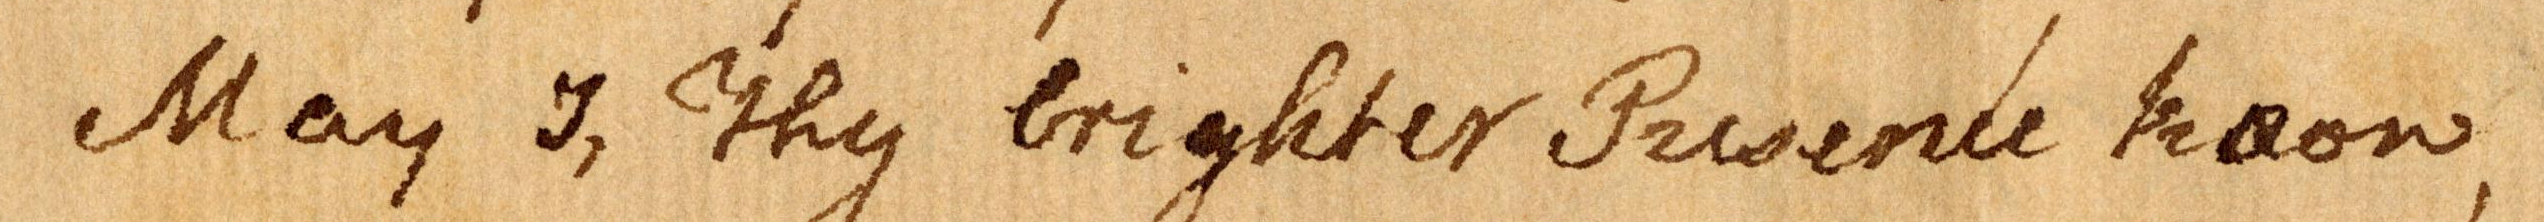May I, Thy brighter Presence know,
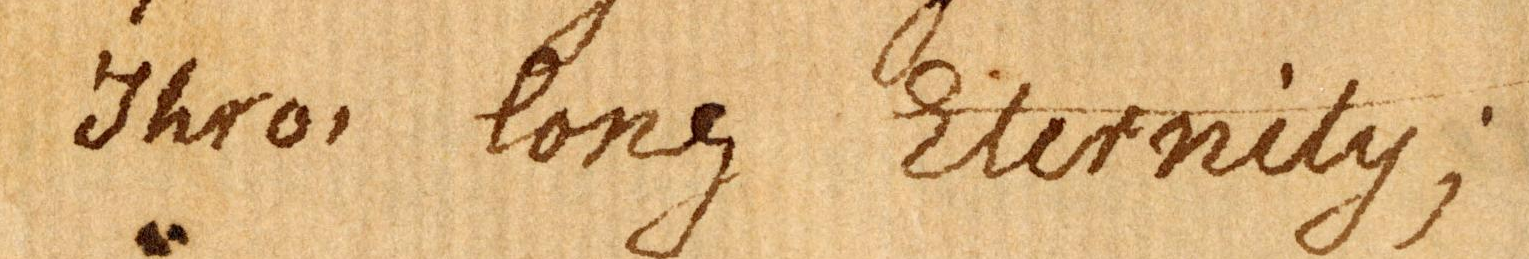Thro' long Eternity;
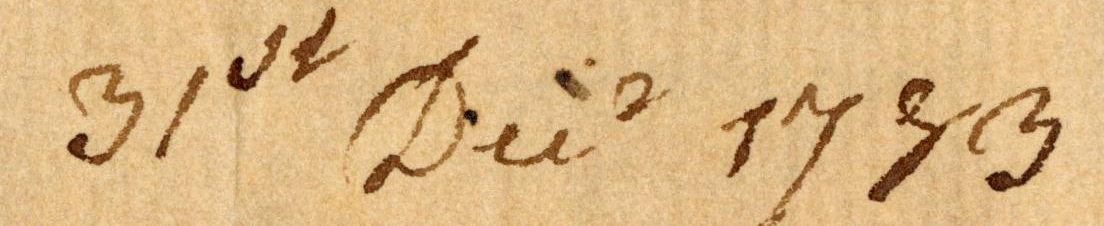31^st Dec^r 1783
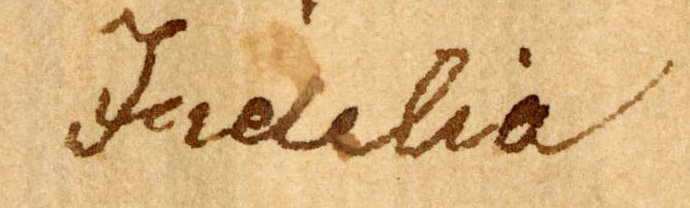Fidelia
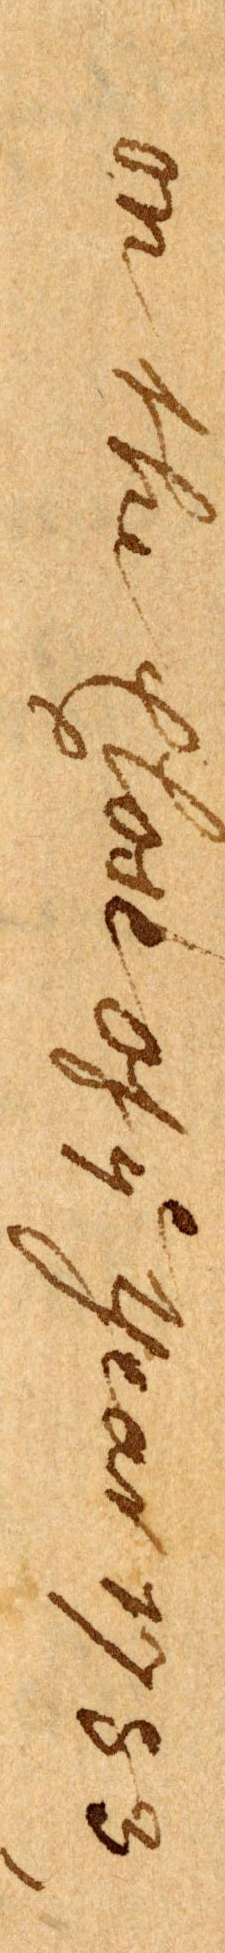on the Close of y^e Year 1783,
